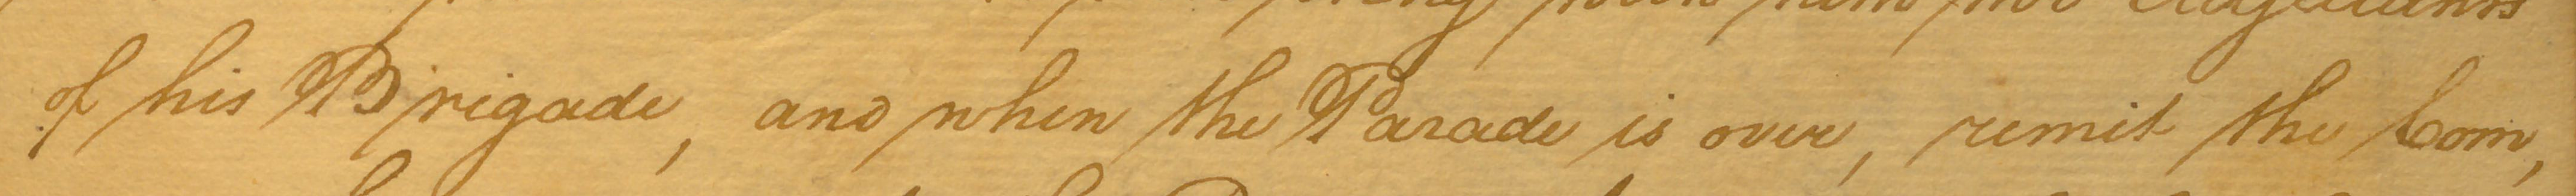of his Brigade, and when the Parade is over, remit the Com-
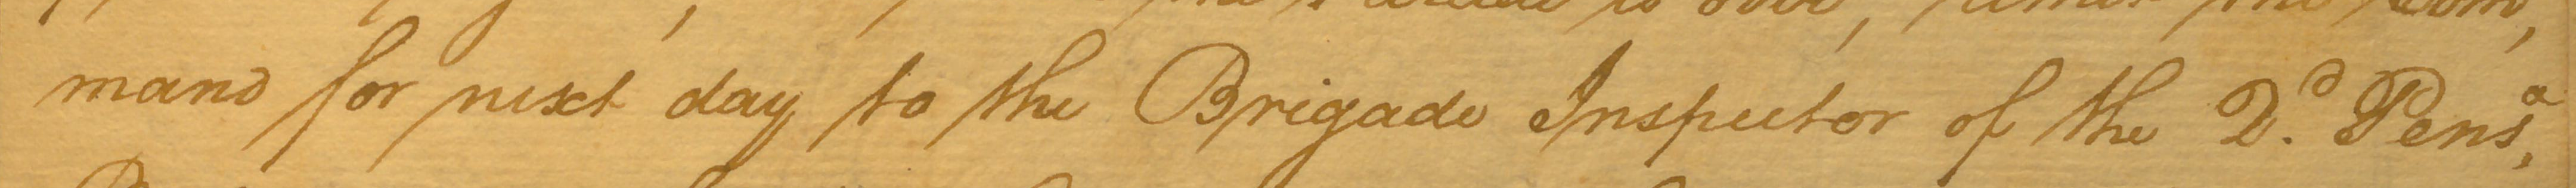mand for next day to the Brigade Inspector of the 2^d. Pens^a.
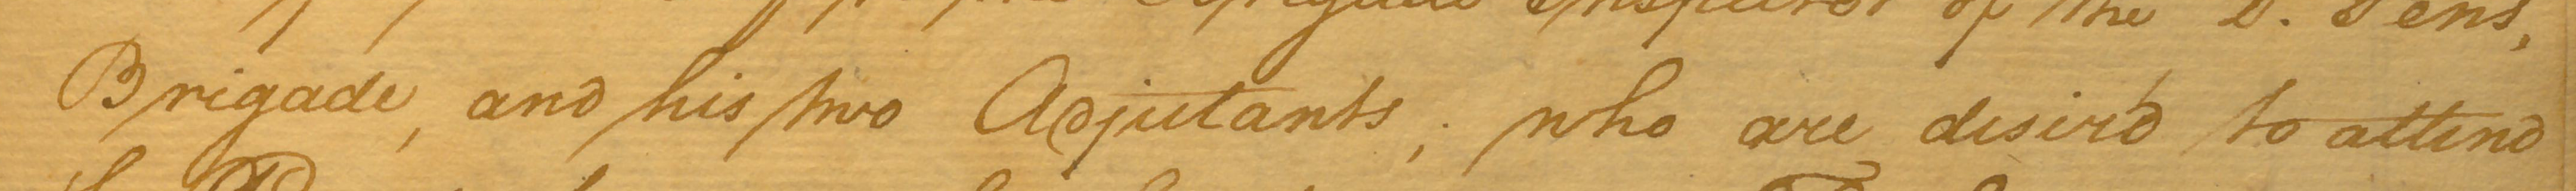Brigade, and his two Adjutants; who are desir'd to attend
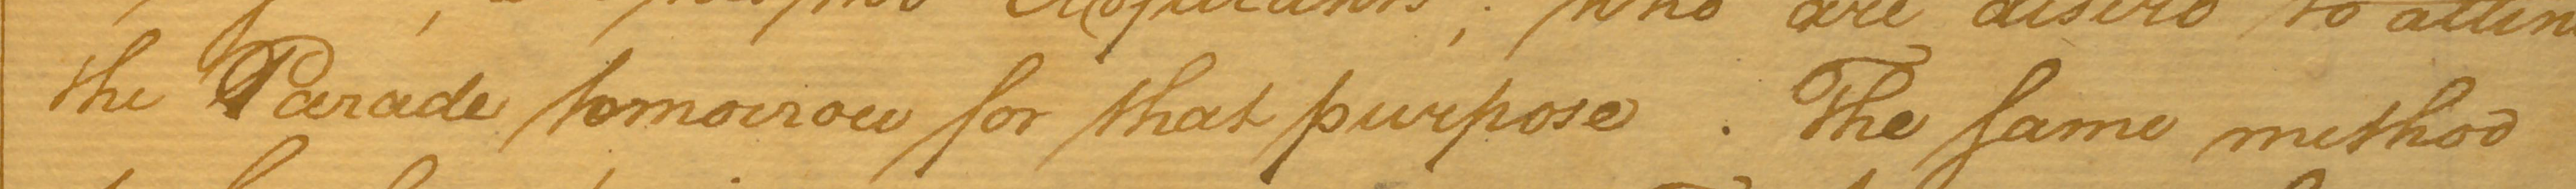the Parade tomorrow for that purpose. The same method
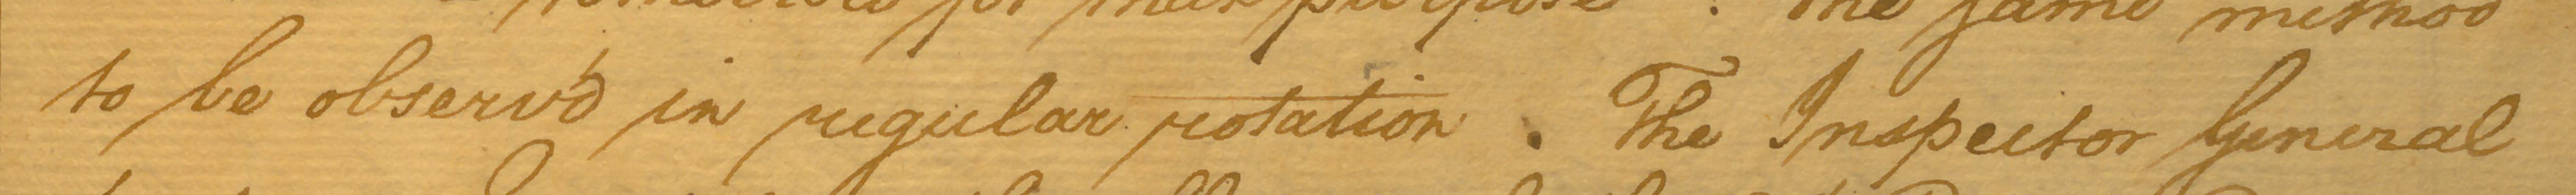to be observ'd in regular rotation. The Inspector General
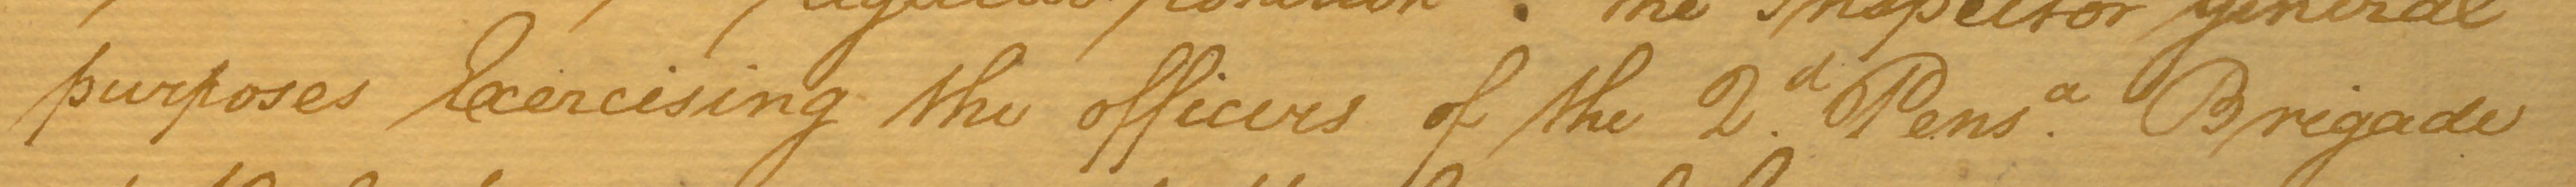purposes Exercising the officers of the 2^d. Pens^a. Brigade
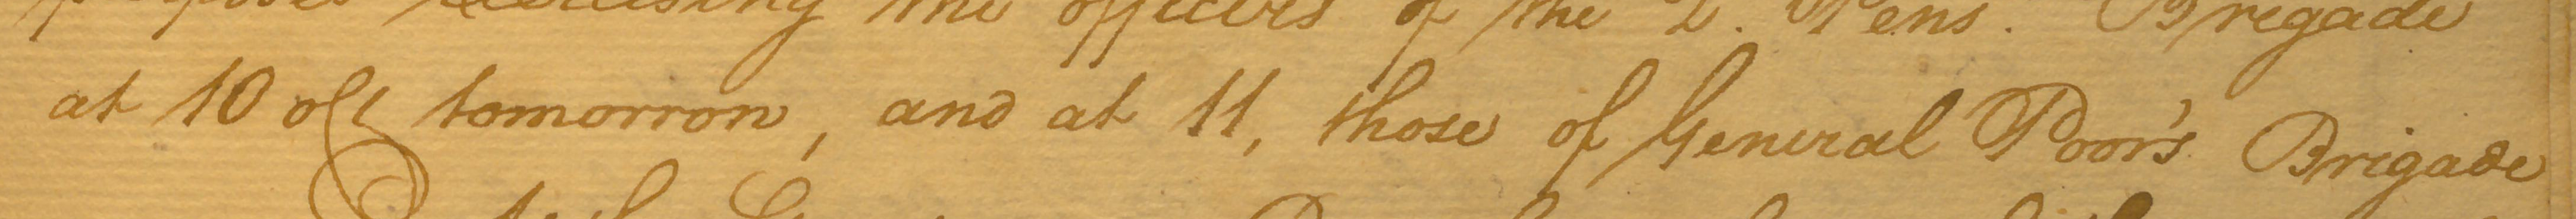at 10 oCl tomorrow, and at 11, those of General Poor's Brigade
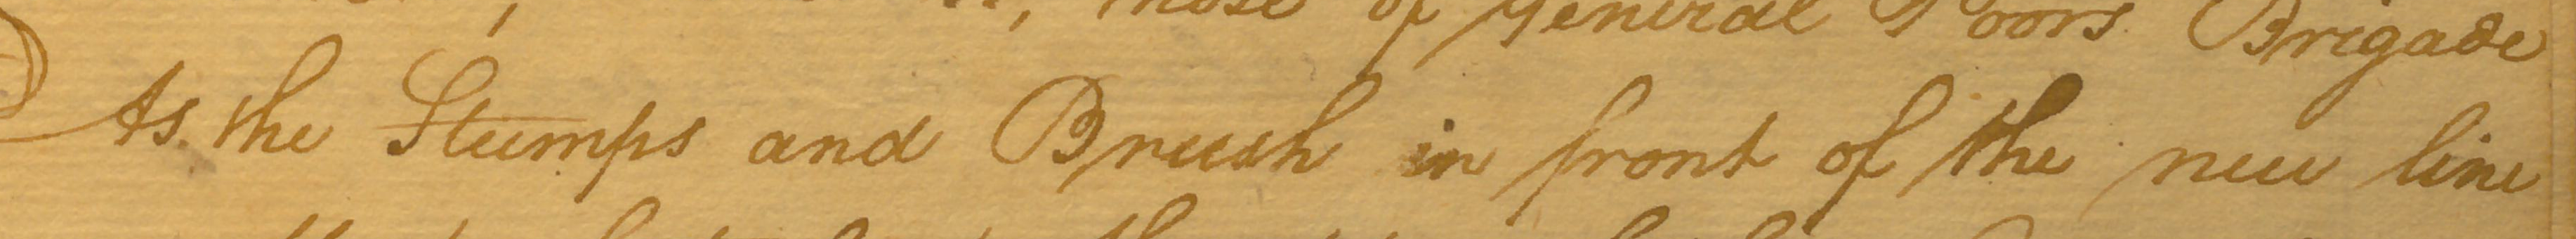As the Stumps and Brush in front of the new line
